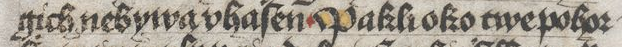gich nebywa vhaẛen.Pakli oko twe pohor¬
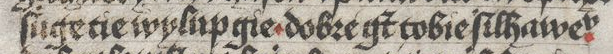ẛuge tie wylup gie.dobre ḡt tobie ẛilhawev.
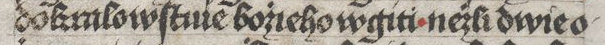do kralowſtuie bożieho wgíti.neżli dwie o¬
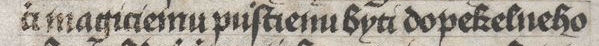či magicíemu puẛtienu byti dopekelneho
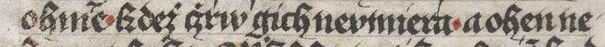ohniē. kdež cżrw gích nevmíera.a ohen ne¬
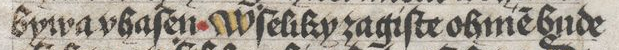bywa vhaſen.Wẛeliky zagiſte ohniē bude
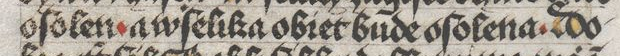oſolen.a wẛelika obiet bude oſolena.Do¬
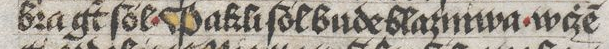bra ḡt ſol.Pakli ſol bude blazniwa.w cżē
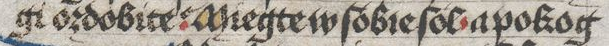gi ozdobite? Miegte w ſobie ſól.a pokog¬
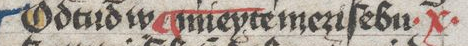Odtud w ,oeyte mezí ſebu. x.
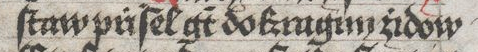ſtraw pṙiẛel ḡt dokragini żidow¬
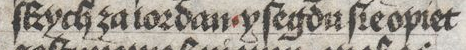ſkych za iordan. y ſegda ſie opiet
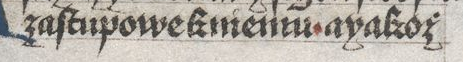zaſtupowe k niemu.ayakoż
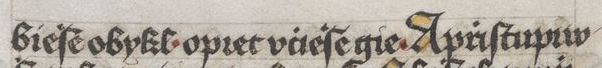bíeẛe obykl.opiet vċieẛe gie.A pṙiſtupiw
